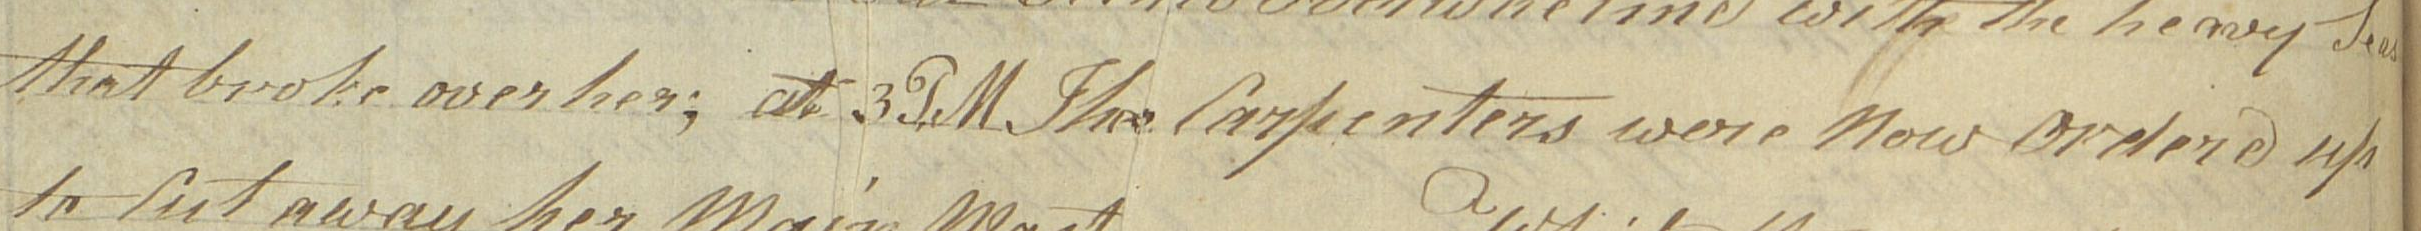that broke over her; at 3 PM The Carpenters were Now Orderd up
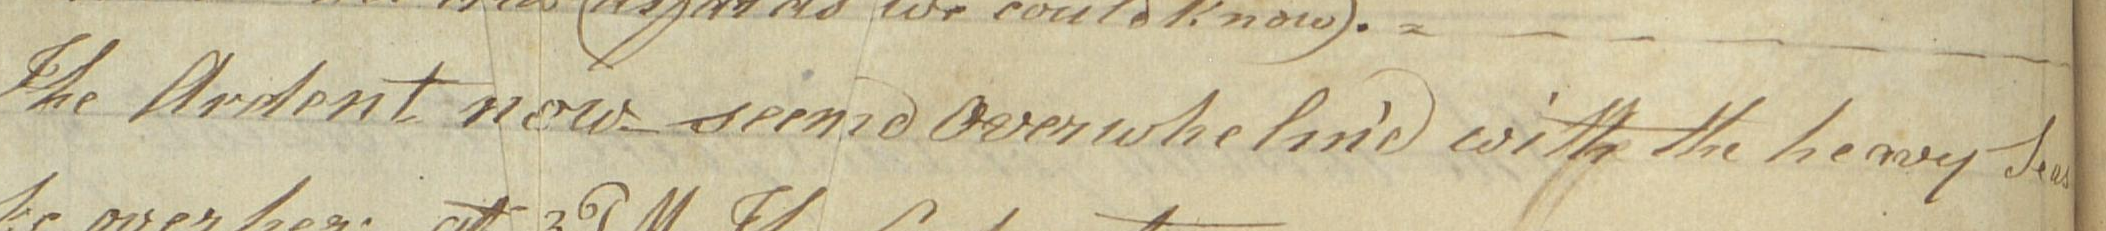The Ardent now seemd overwhelm'd with the heavy seas
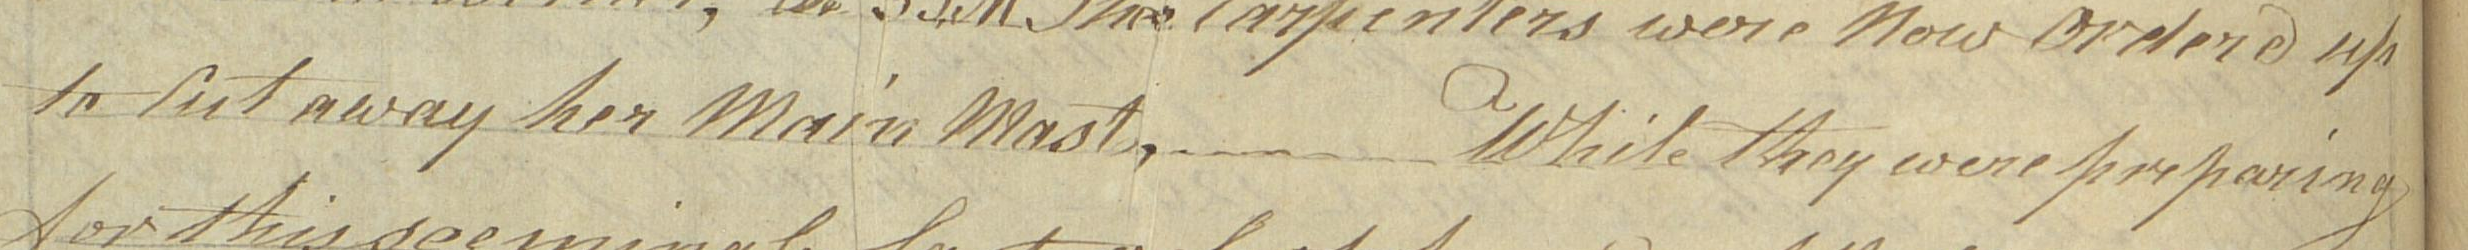so Cut away her Main Mast, While they were preparing
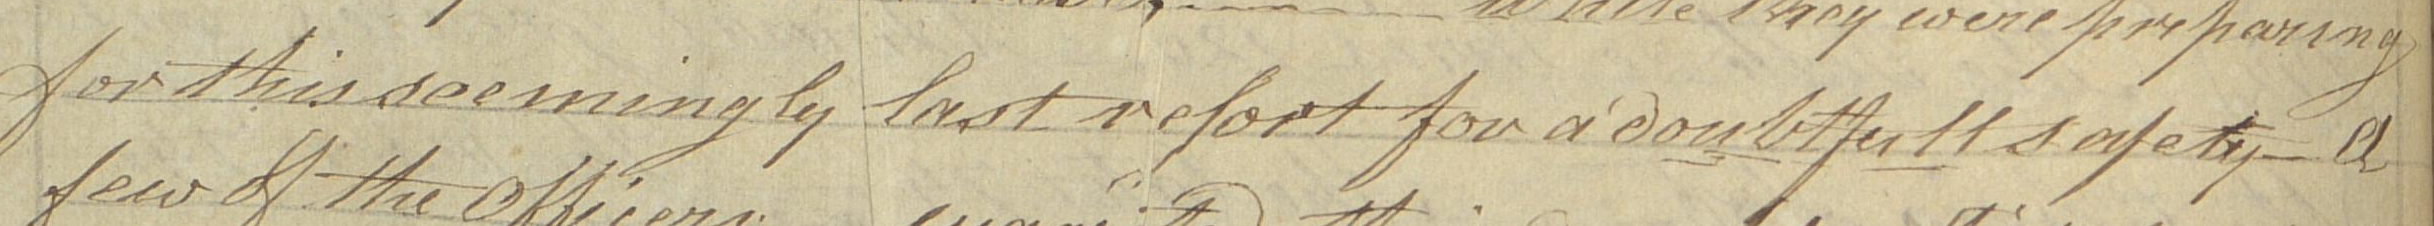for this seemingly last resort for a doubtfull safety. A
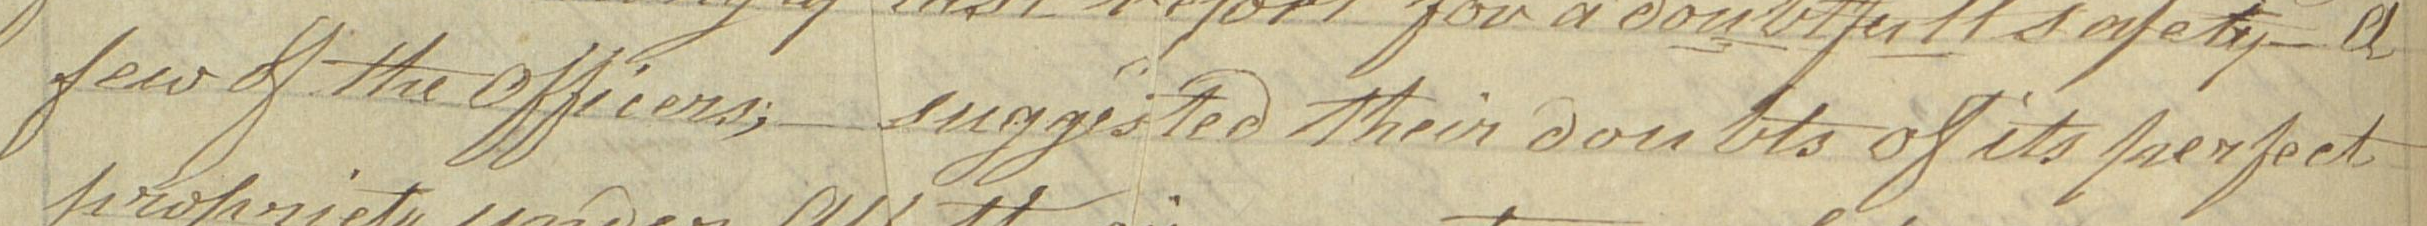few of the Officers, suggested their doubts of its perfect
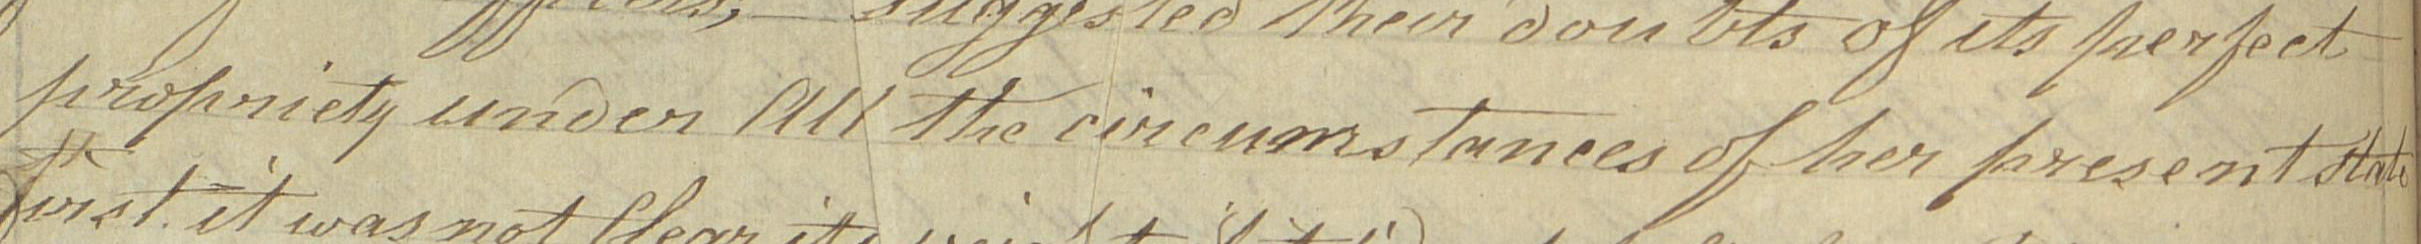propriety under All the circumstances of her present state
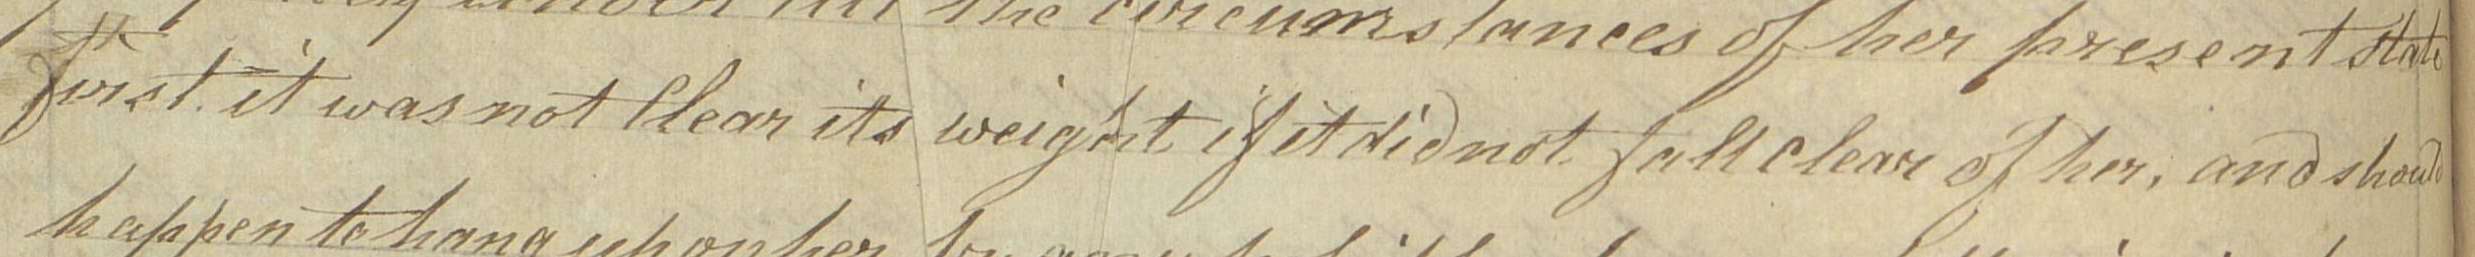first it was not clear its weight of it did not fall clear of her, and show
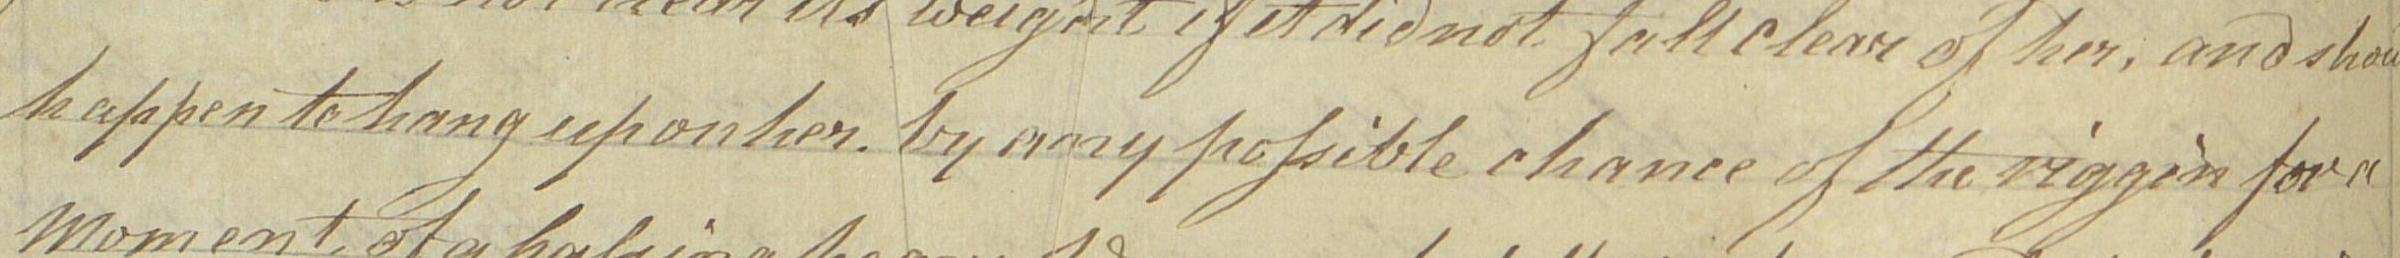happen to hang upon her by any possible chance of the riggin for a
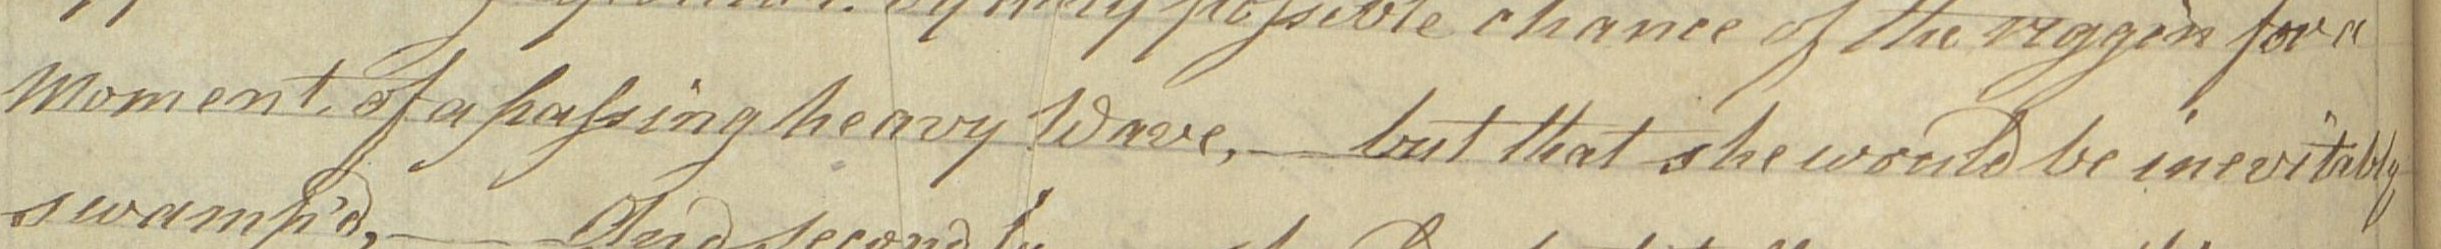moment of a passing heavy wave, but that she would be inevitably
